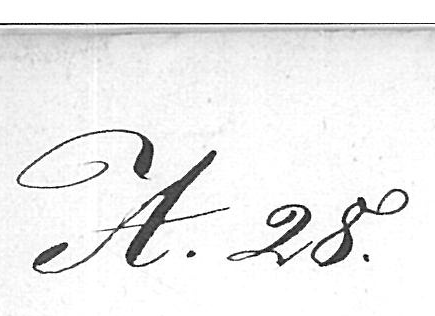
A. 28.
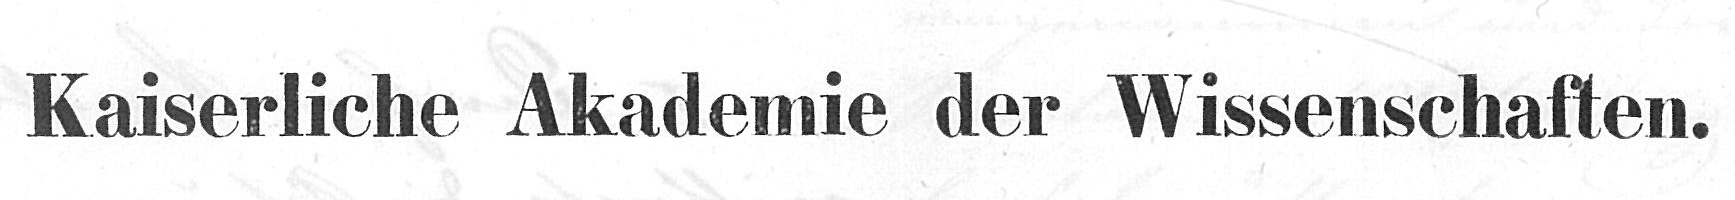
Kaiserliche Akademie der Wissenschaften.
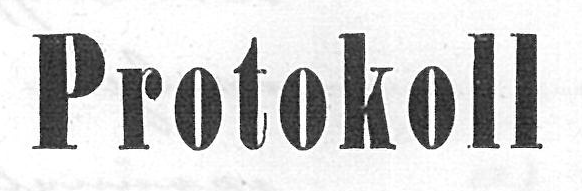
Protokoll
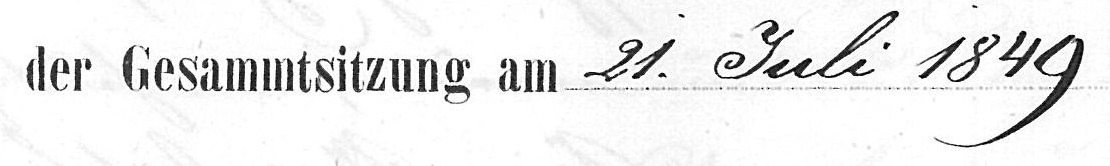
der Gesammtsitzung am 21. Juli 1849
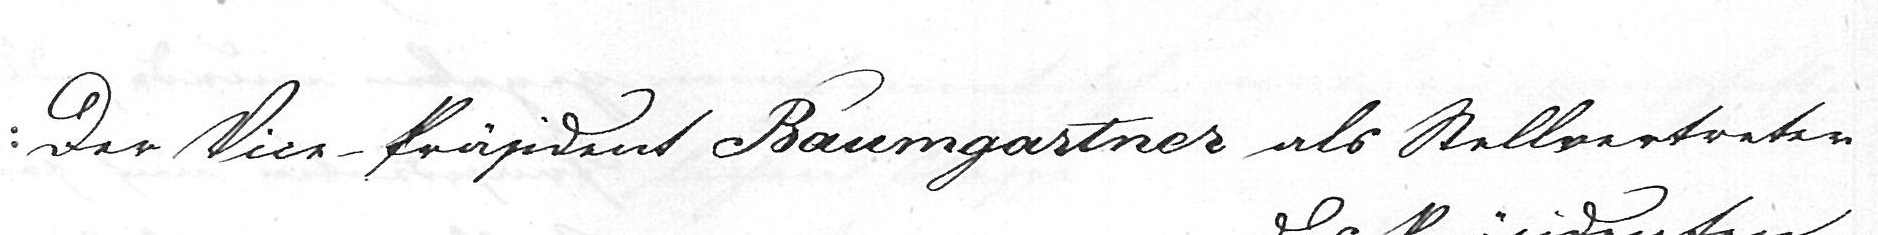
Der Vice- Präsident Baumgartner als Stellvertreter
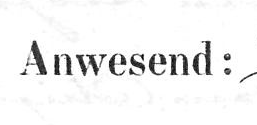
Anwesend:
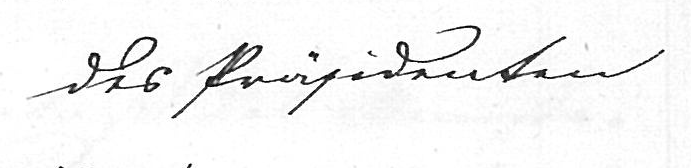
des Präsidenten
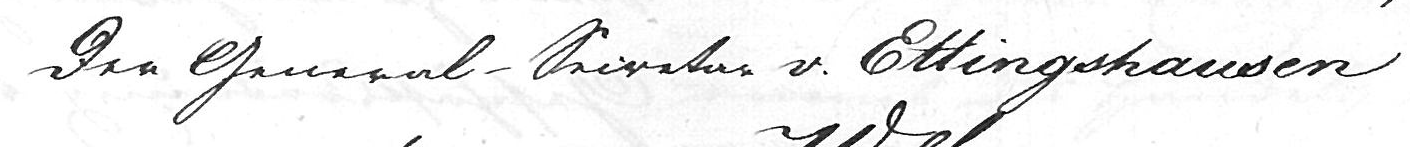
Der General-Secretär v. Ettingshausen
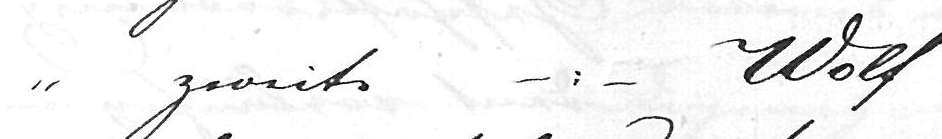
" zweite -:- Wolf
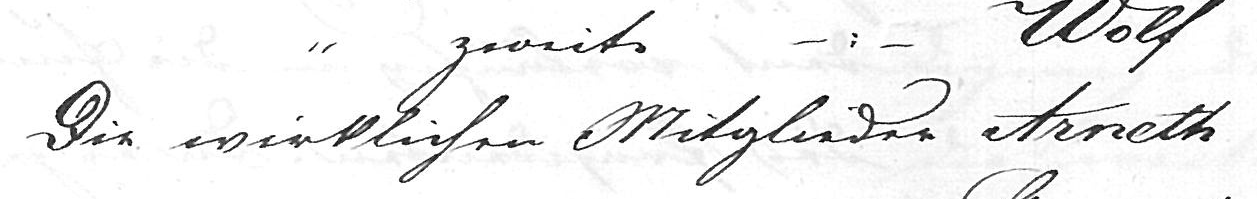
Die wirklichen Mitglieder Arneth
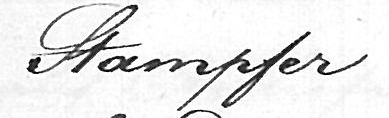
Stampfer
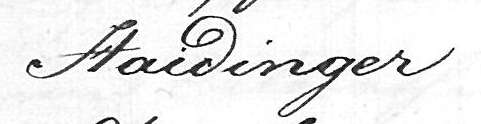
Haidinger
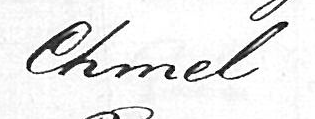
Chmel
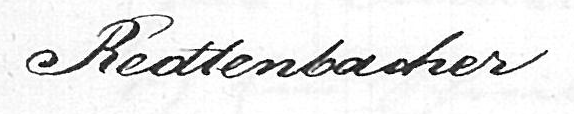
Redtenbacher
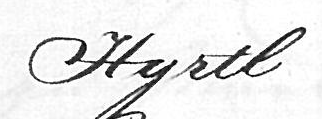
Hyrtl
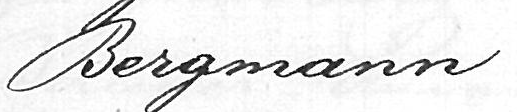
Bergmann
